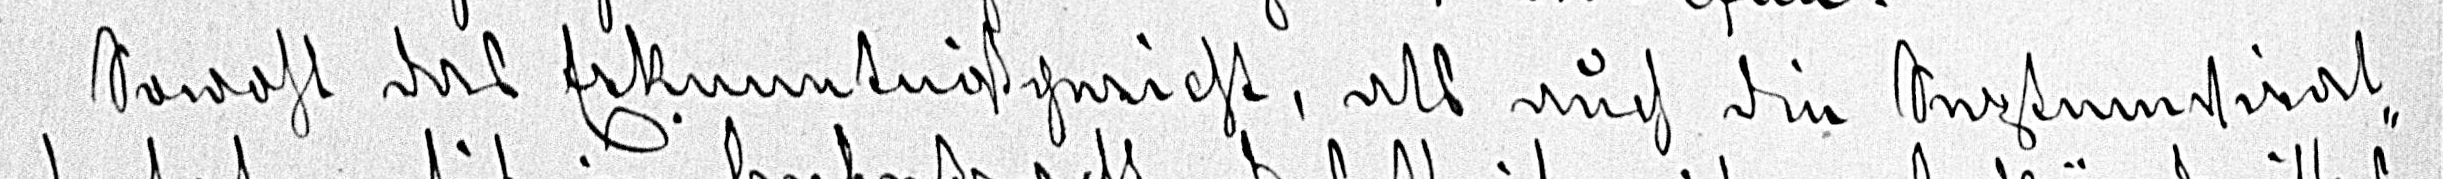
Sowohl des Erkenntnißgericht, als auch die Septemviral¬
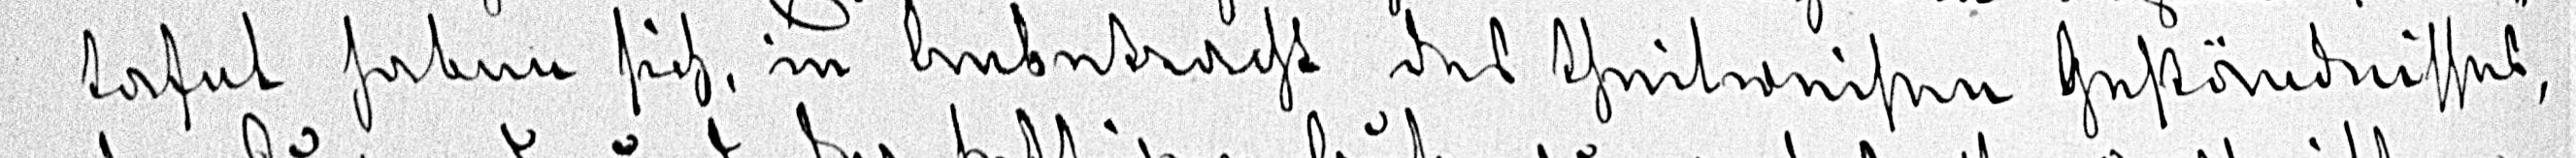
tafel haben sich, in Anbetracht des Theilweisen Geständnisses,
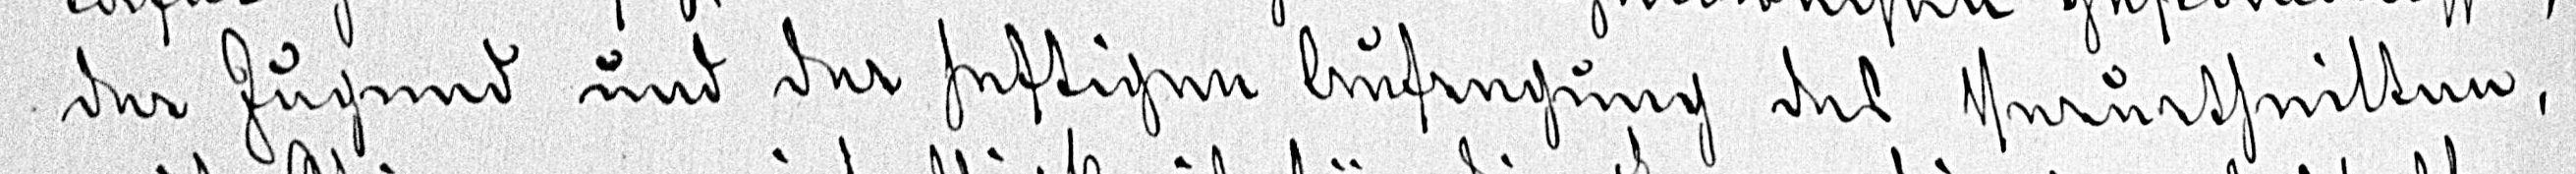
der Jugend und der heftigen Aufregung des Verurtheilten,
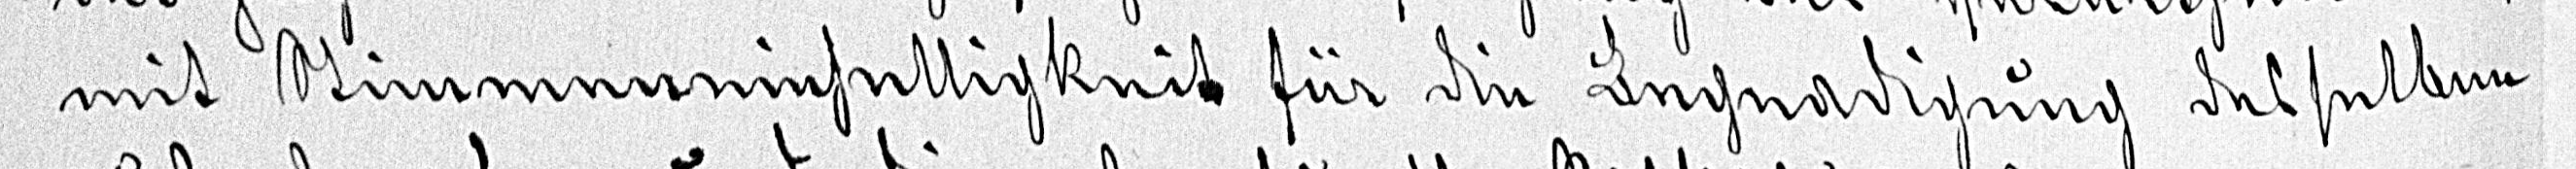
mit Stimmeneinhelligkeit für die Begnadigung desselben
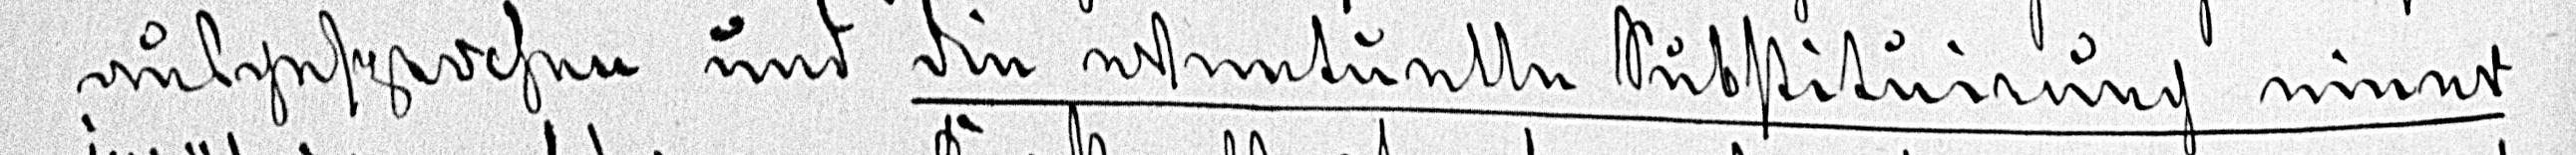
ausgesprochen und die eventuelle Substituirung einer
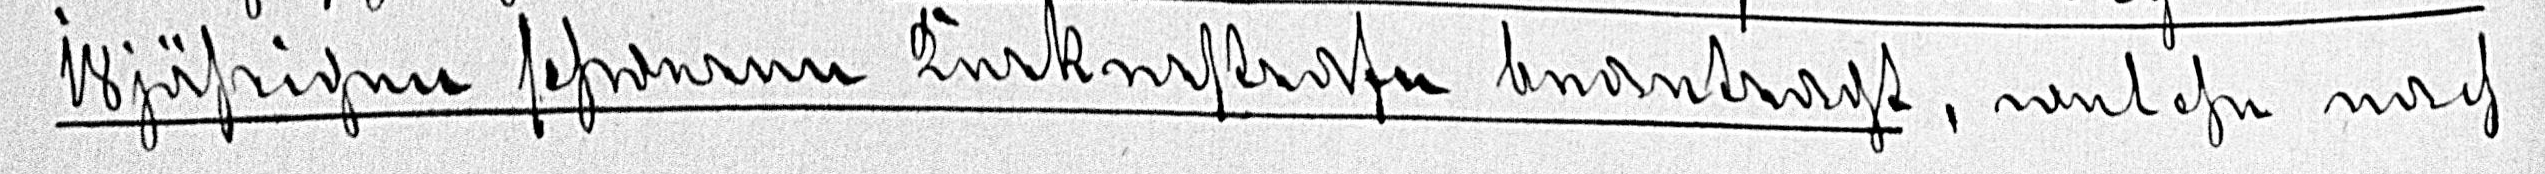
18jährigen schweren Kerkerstrafe beantragt, welche nach
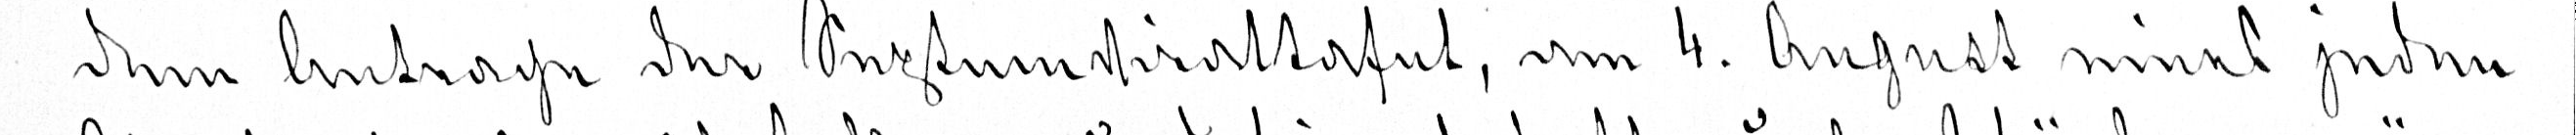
dem Antrage der Septemviraltafel, am 4. August eines jeden
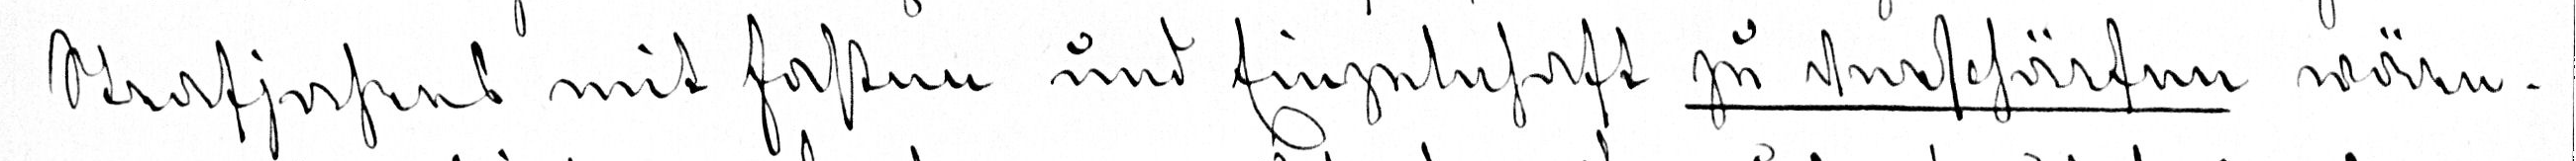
Strafjahres mit Fasten und Einzelnhaft zu verschärfen wäre.
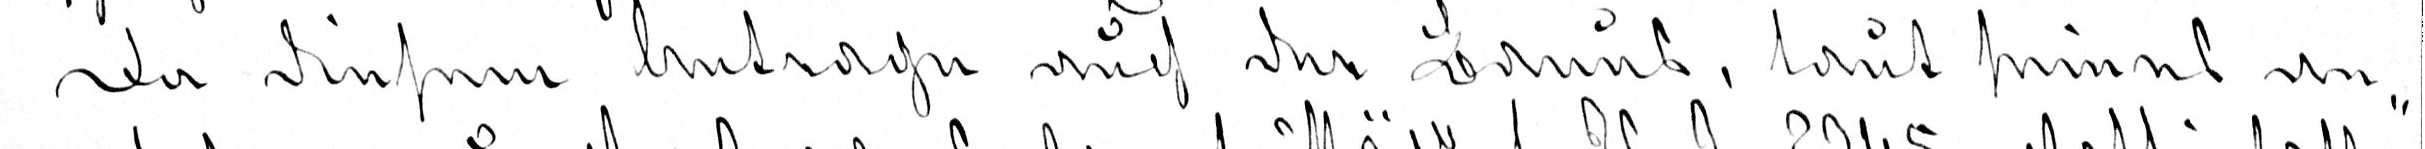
Da diesem Antrage auch der Banus, laut seines an¬
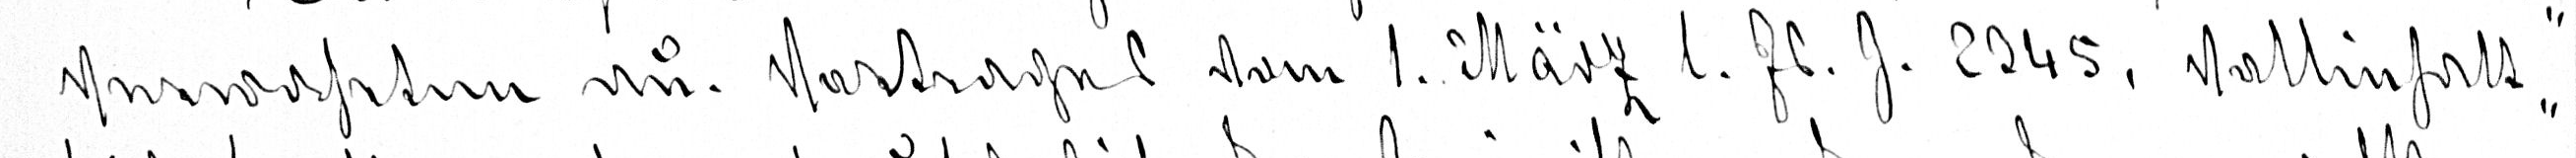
verwahrten au. Vortrages vom 1. März l. Fs. J. 2345, vollinhalt¬
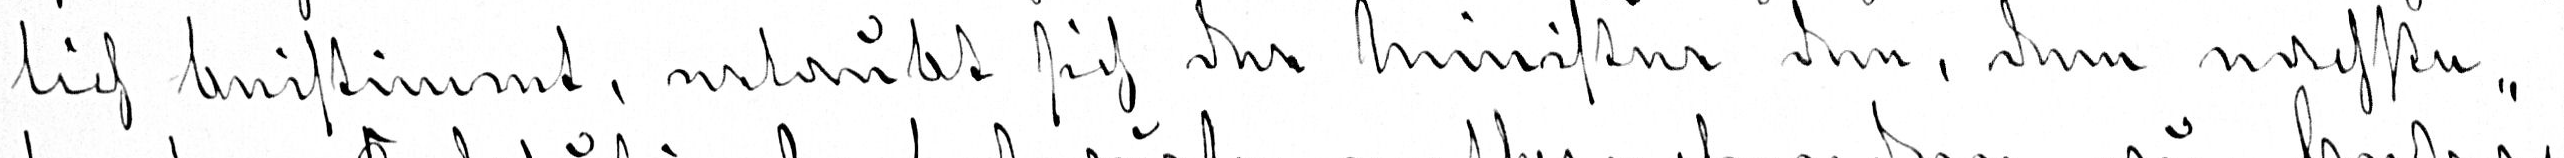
lich beistimmt, ertaubt sich der Minister den, dem nächste¬
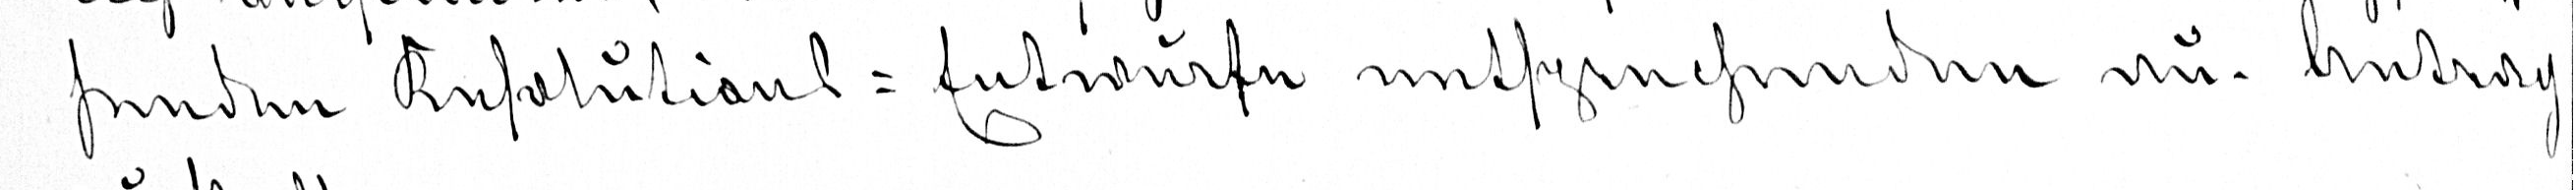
henden Resolutions-Entwurfe entsprechenden au. Antrag
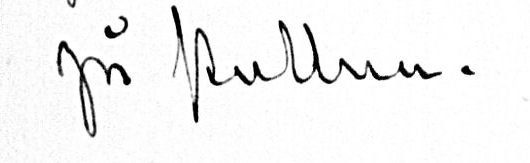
zu stellen.
